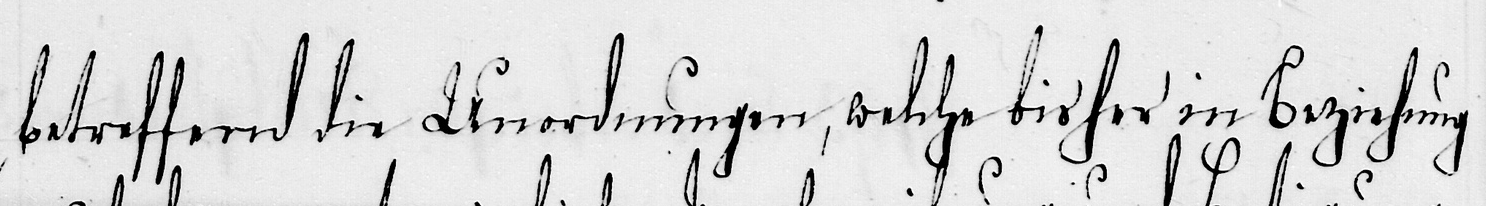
betreffend die Unordnungen, welche bisher in Beziehu¬
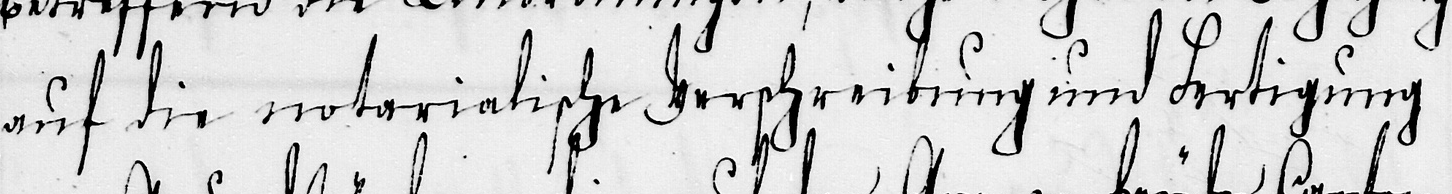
auf die notarialische Verschreibung und Fertigung
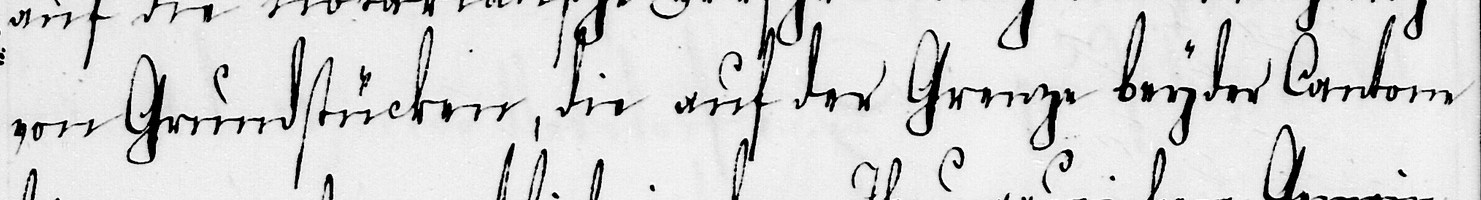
von Grundstücken, die auf der Grenze beyder Cantone
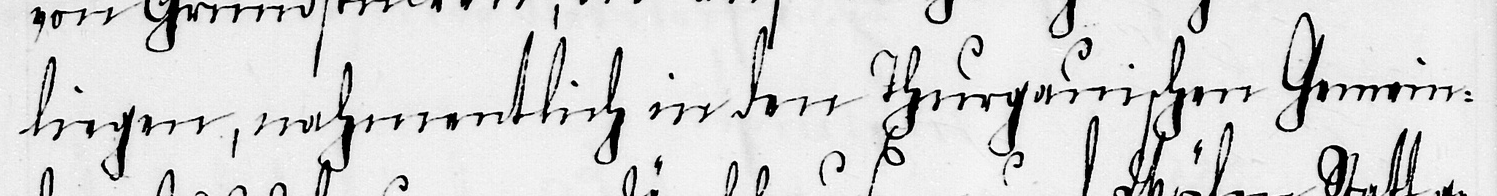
liegen, nahmentlich in den Thurgauischen Gemein¬
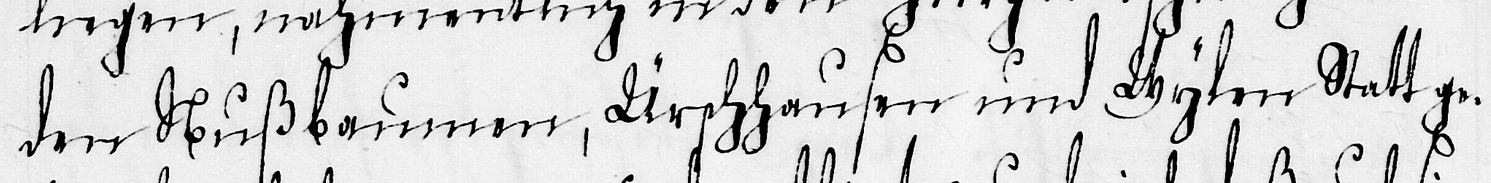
den Nußbaumen, Ürschhausen und Wylen Statt g¬
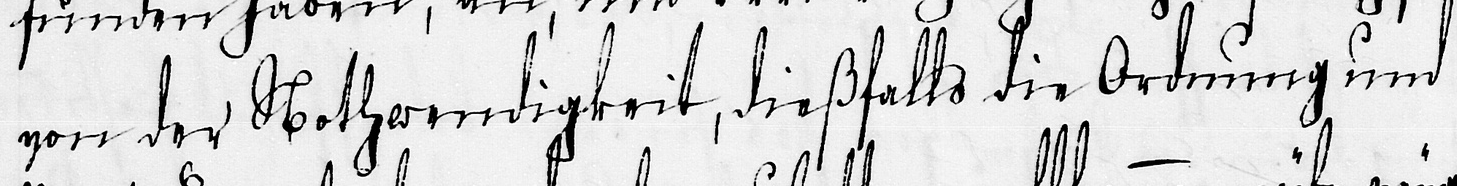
von der Nothwendigkeit, dießfalls die Ordnung und
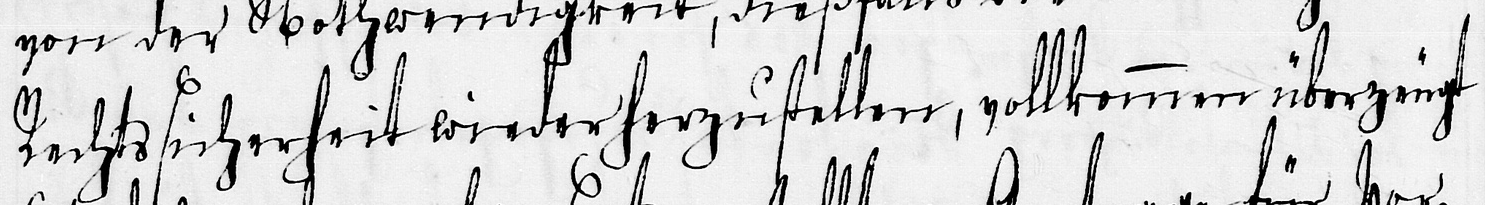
Rechtssicherheit wieder herzustellen, vollkommen überzeugt
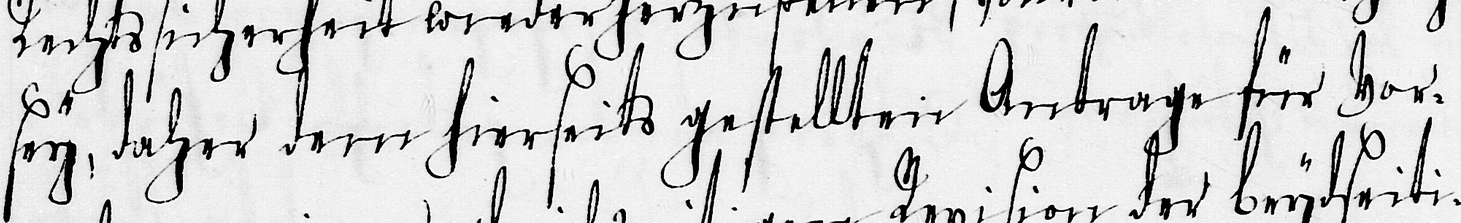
sey, daher dem hierseits gestellten Antrage für Vor¬
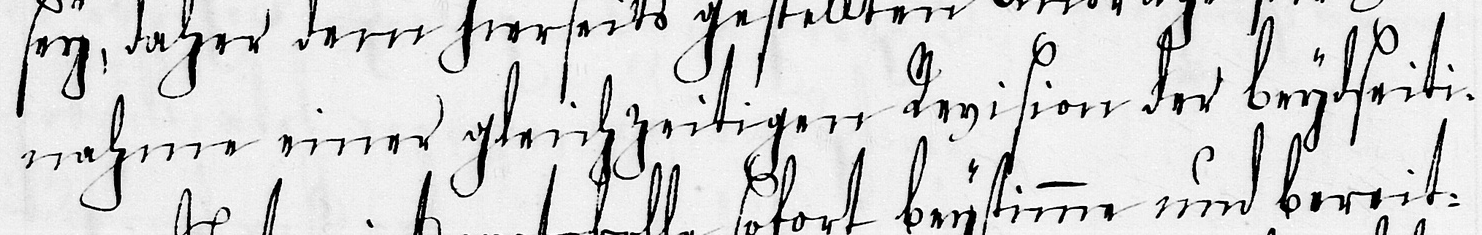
nahme einer gleichzeitigen Revision der beydseiti¬
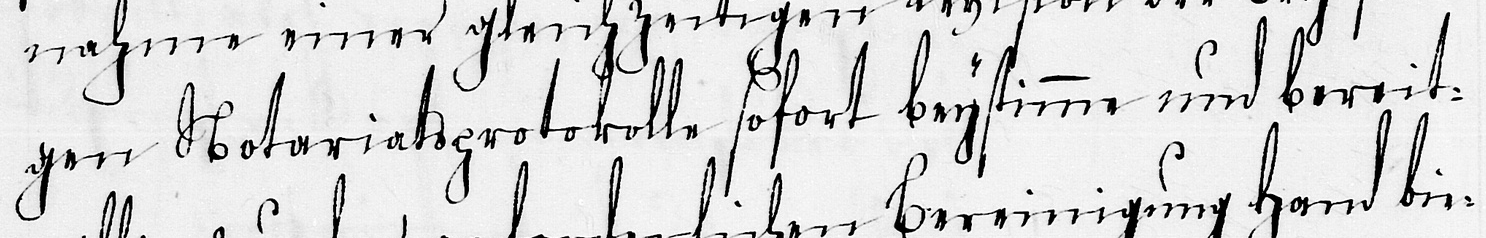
gen Notariatsprotokolle sofort beystimme und bereit¬
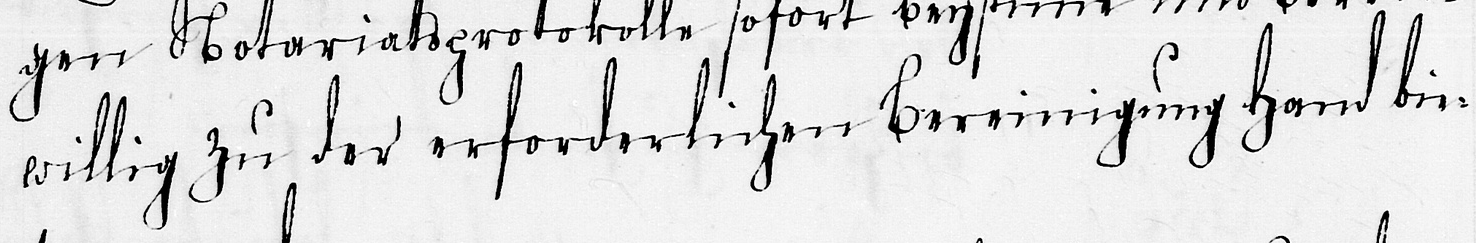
willig zu der erforderlichen Bereinigung Hand bie¬
